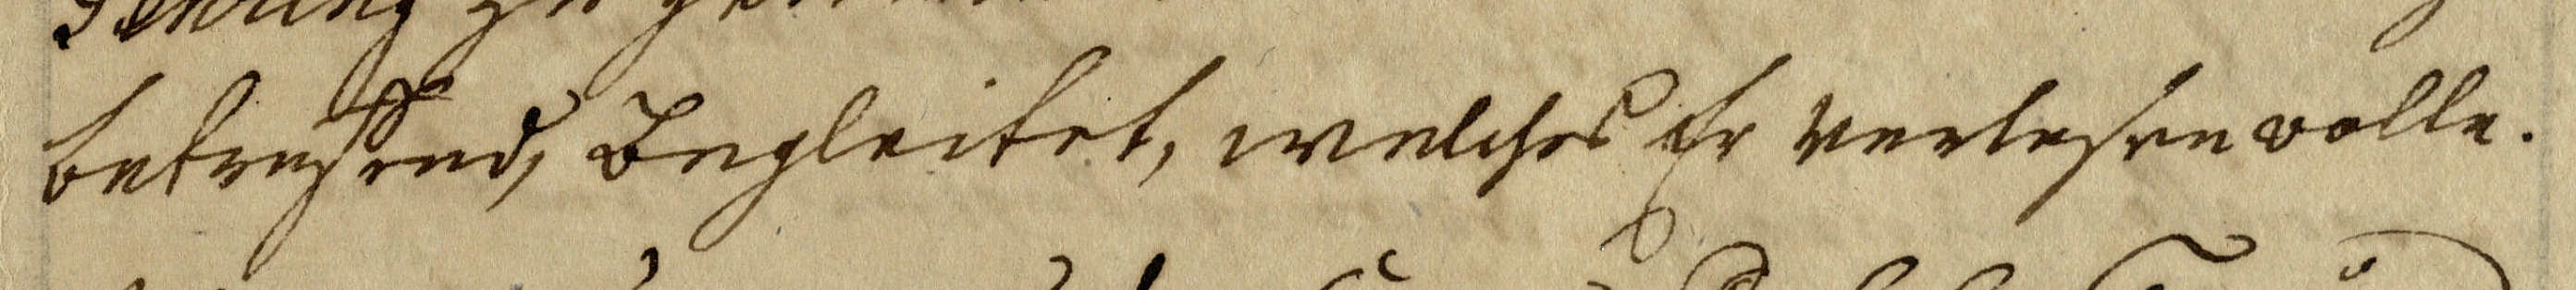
betreffend, begleitet, welches Er verlesen wolle.
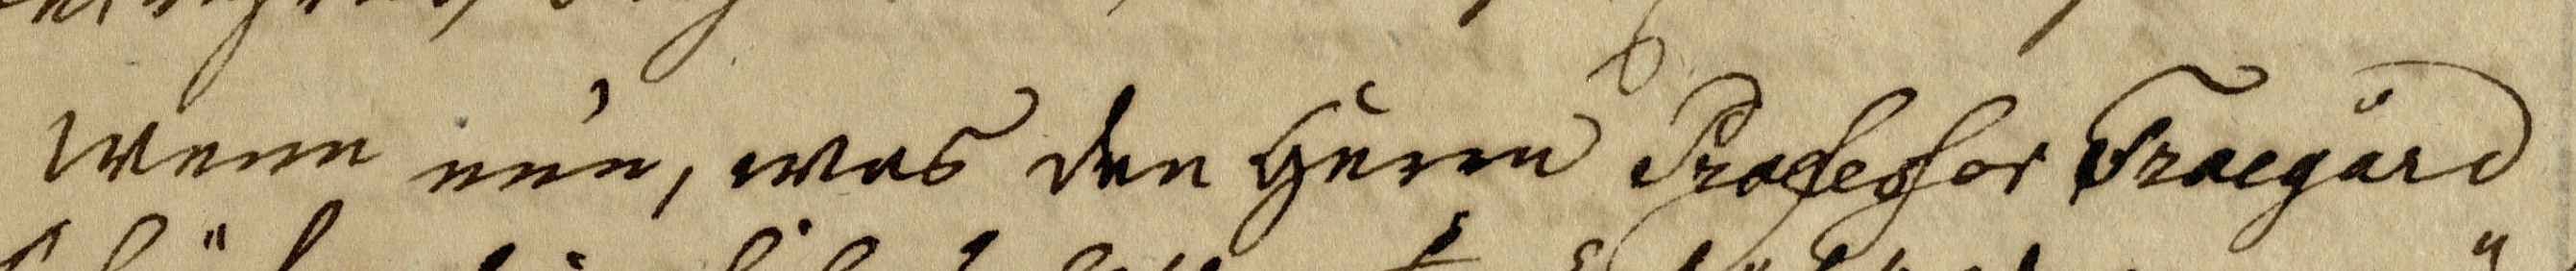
Wenn nun, was den Herrn Professor Traegård
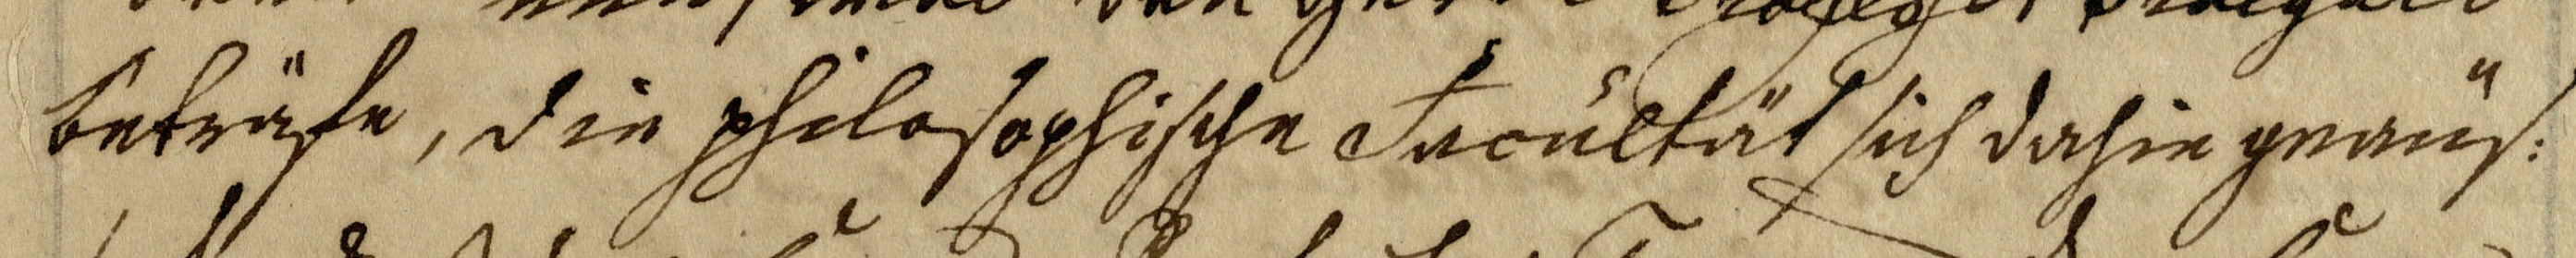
beträfe, die philosophische Facultät sich dahin geäus¬
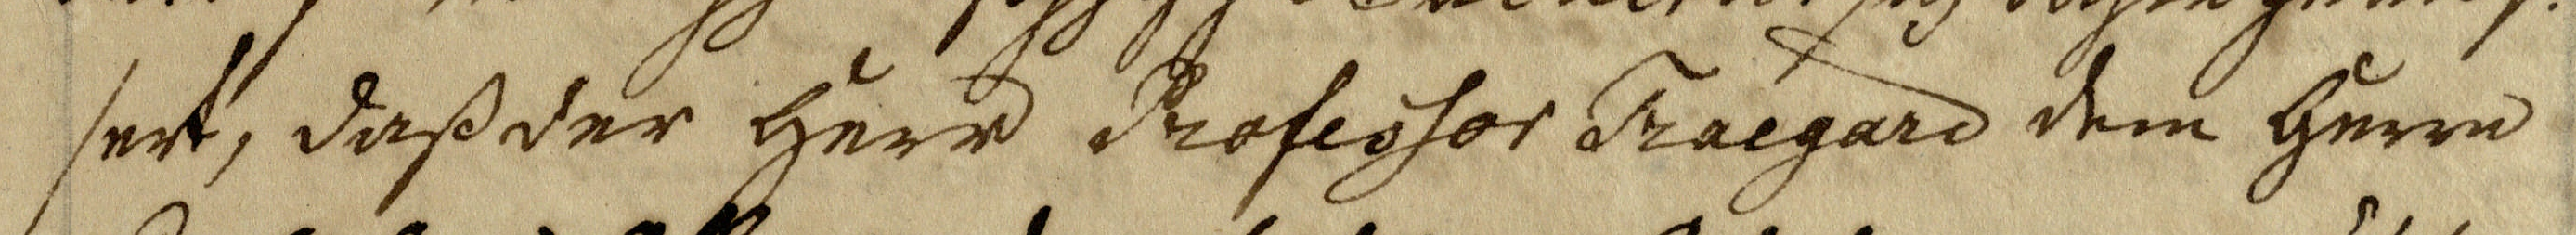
sert, daß der Herr Professor Traegard dem Herrn
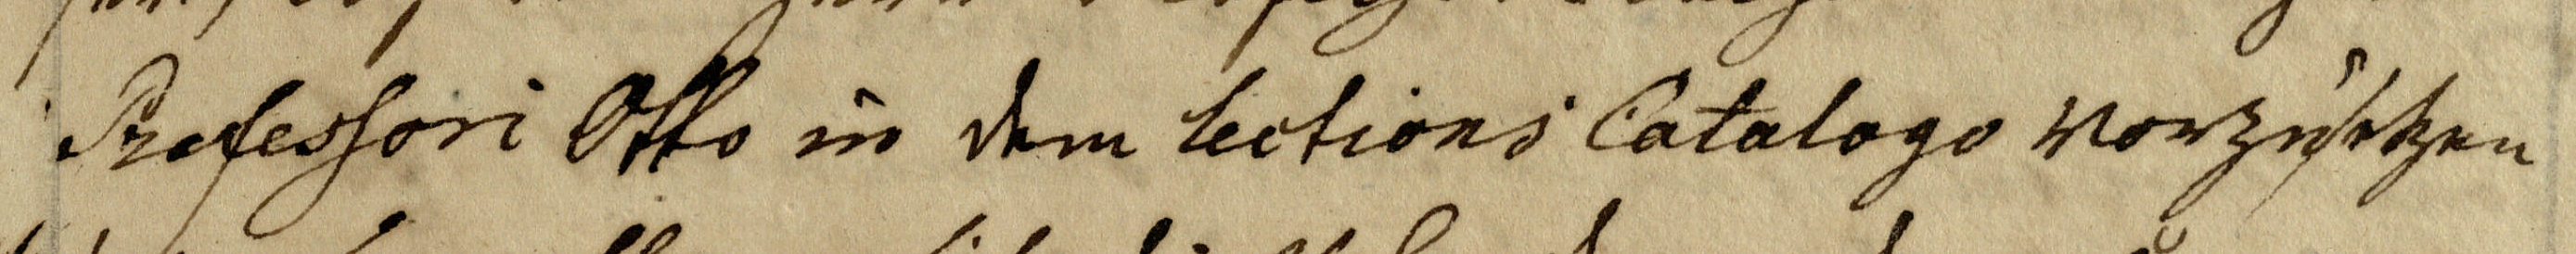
Professori Otto in dem Lections Catalogo vorzusetzen
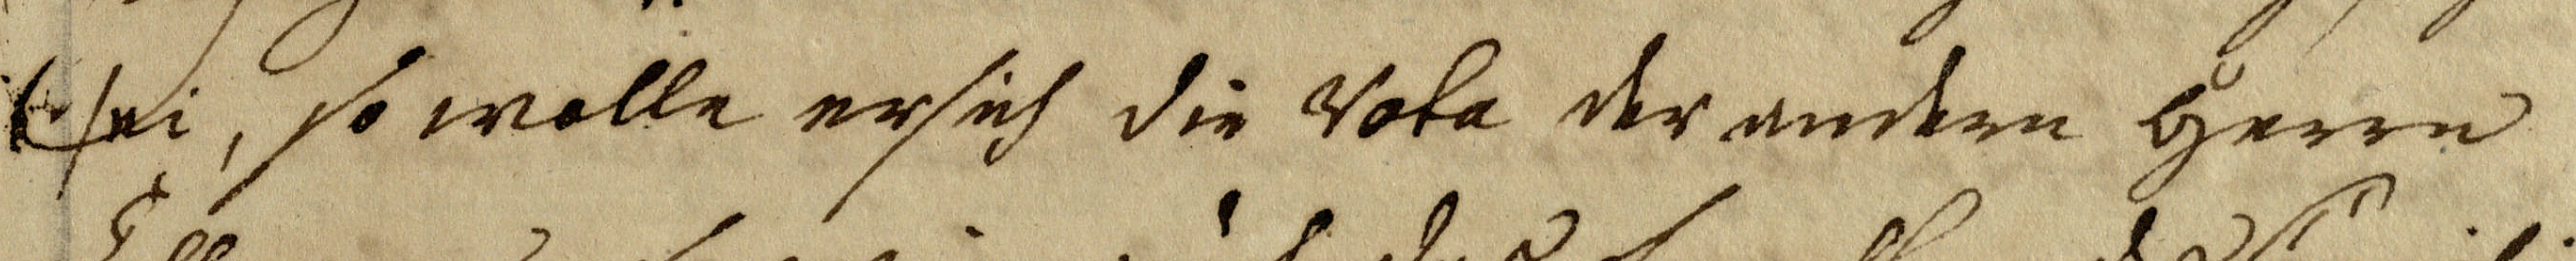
sei, so wolle er sich die vota der andern Herrn
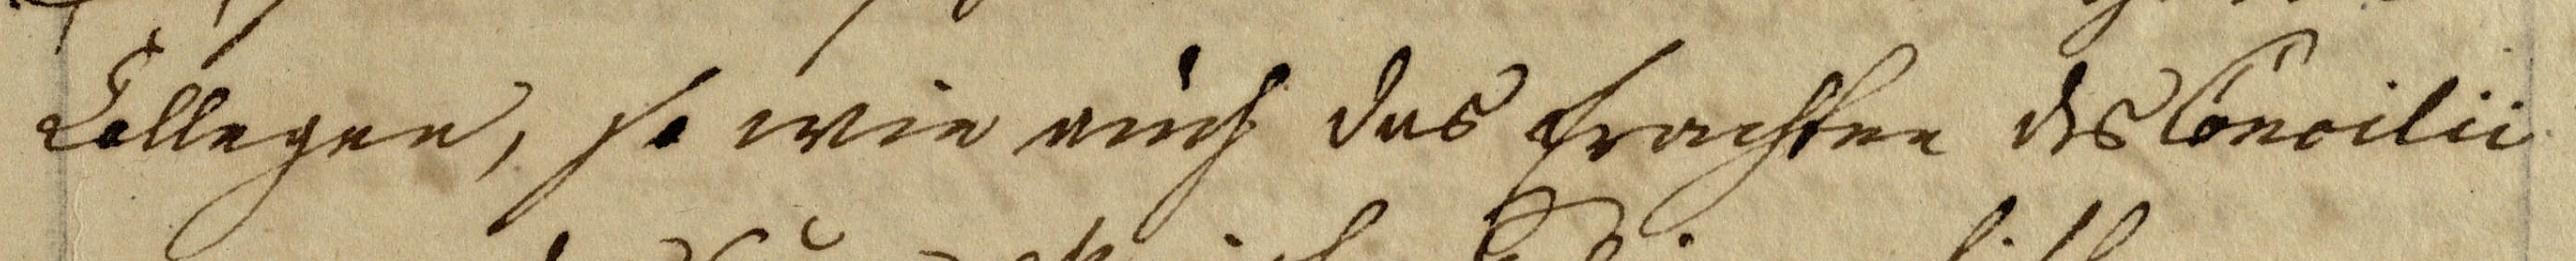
Collegen, so wie auch das Erachten des Concilii
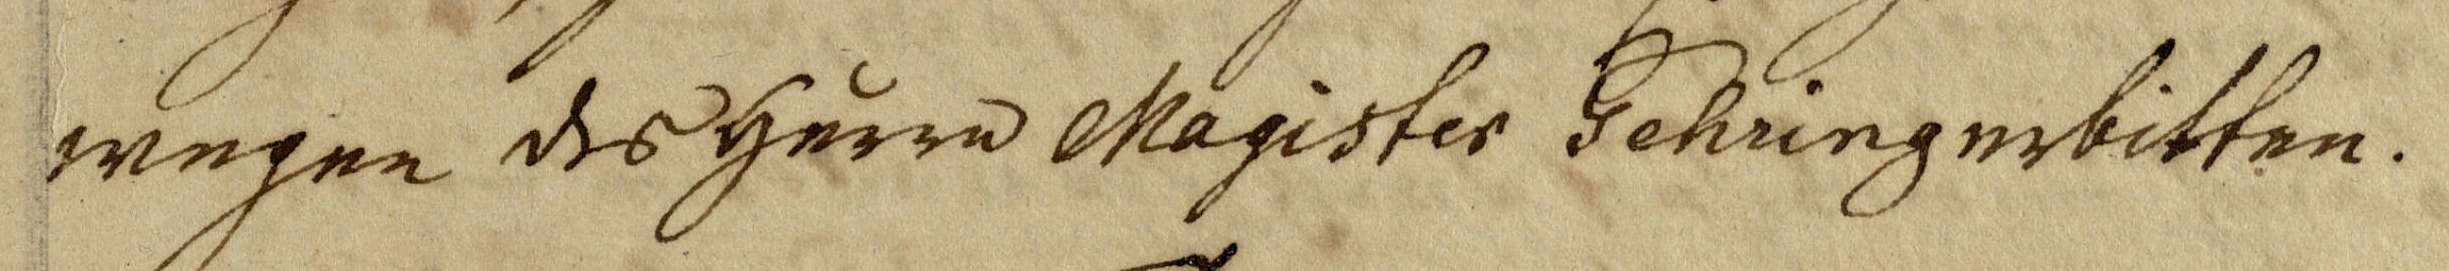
wegen des Herrn Magister Gehring erbitten.
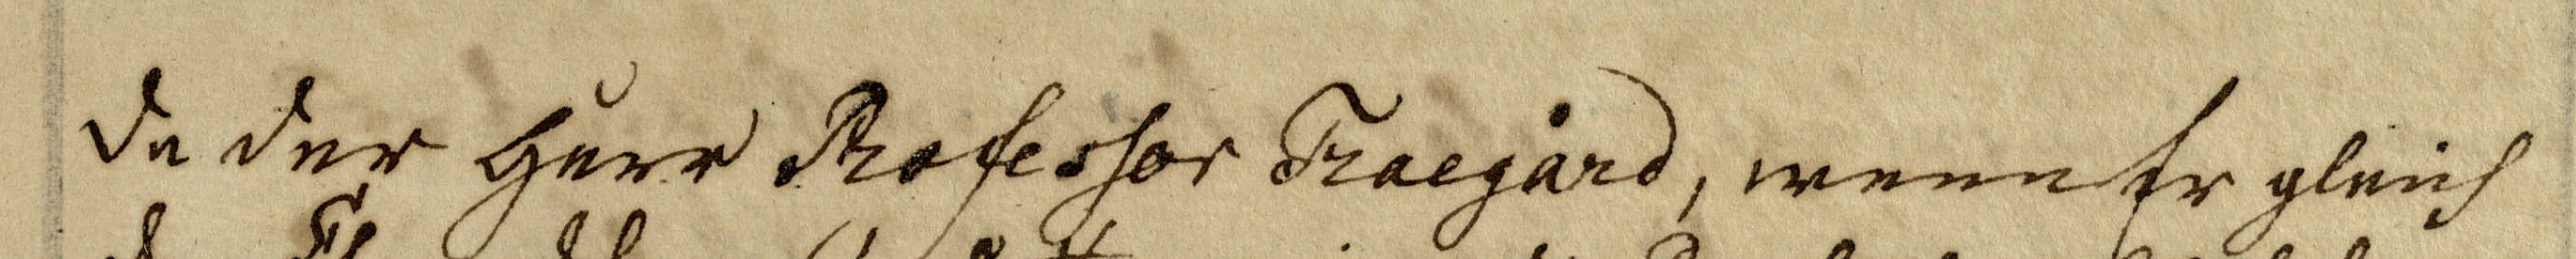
Da der Herr Professor Traegård, wenn Er gleich
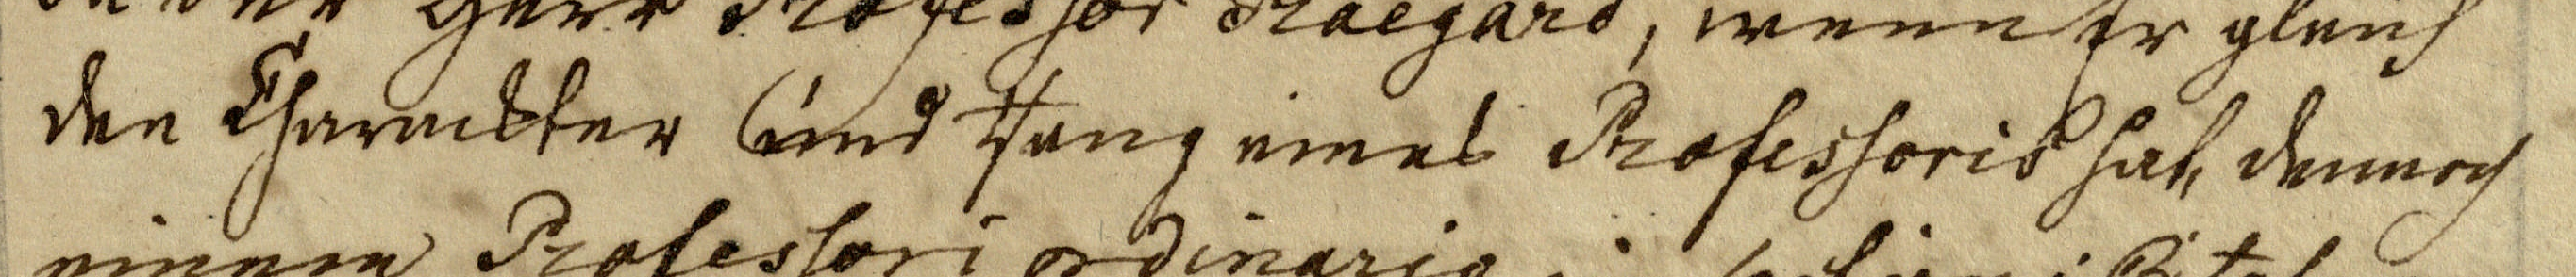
den Charakter und Rang eines Professoris hat, dennoch
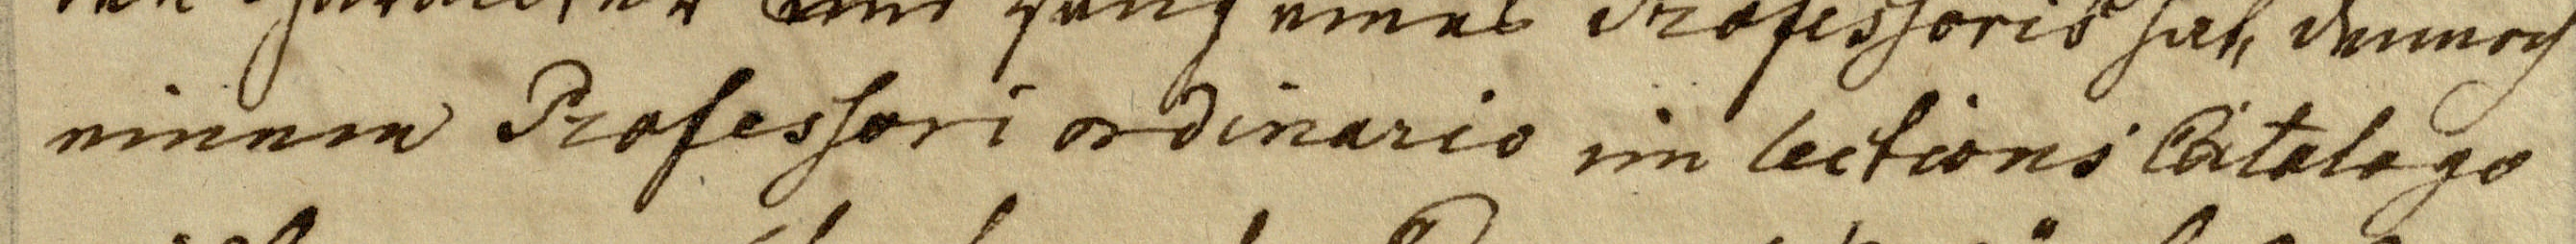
einem Professori ordinario im Lections Catalogo
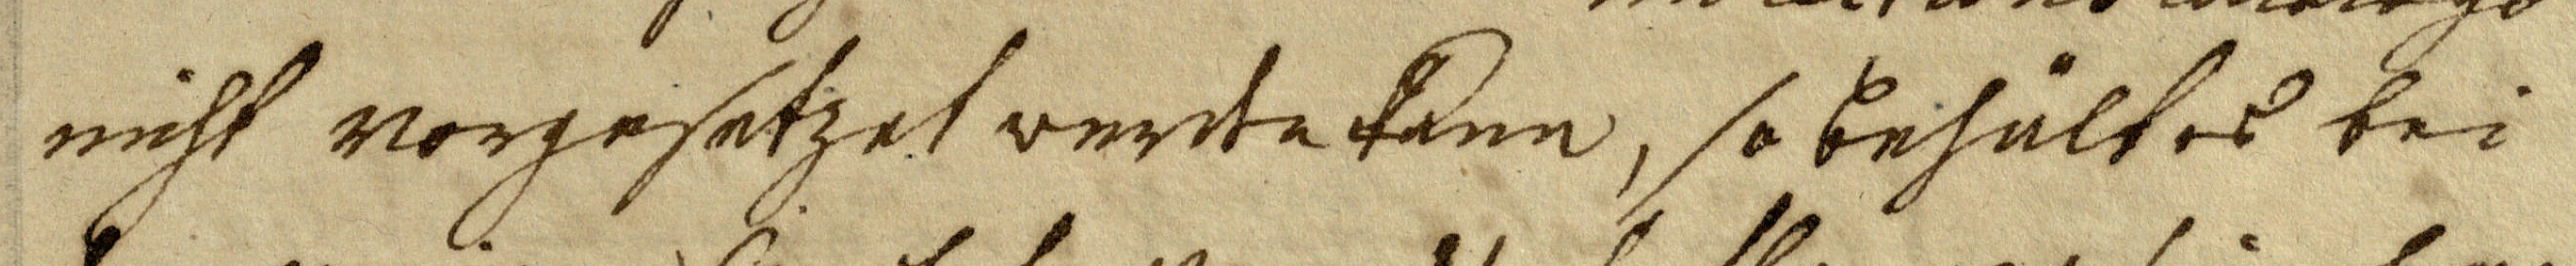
nicht vorgesetzet werden kann, so behält es bei
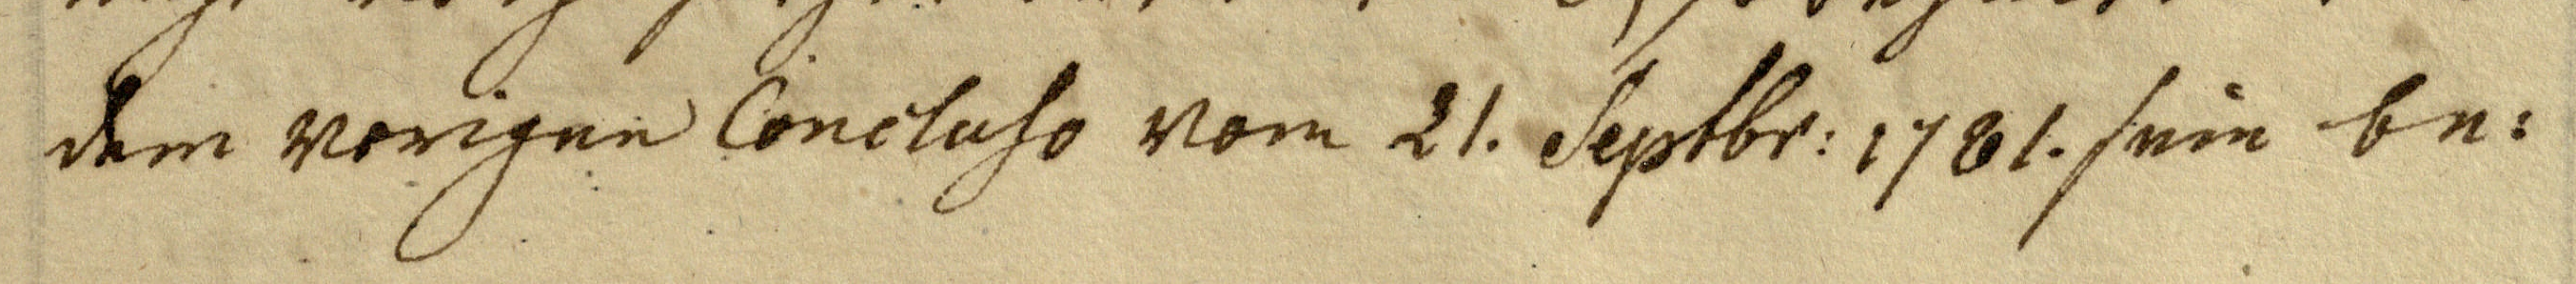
dem vorigen Concluso vom 21. Septbr. 1781. sein be¬
